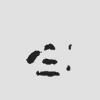㠯（以）
